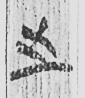之
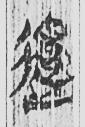還
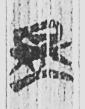昷
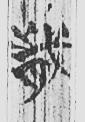歲
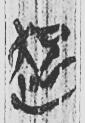起
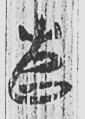{山𡴎}
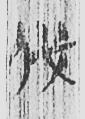伐
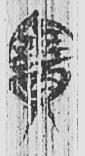賽
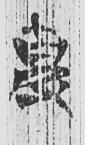尅
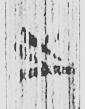之
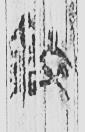殺
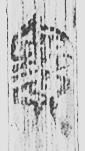賽
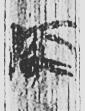侯
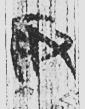取
